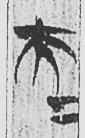夫=
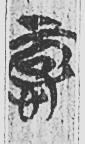{心亓子}
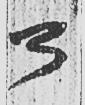乃
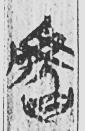{虍皆}
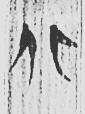北
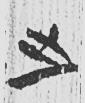之
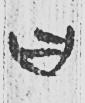曰
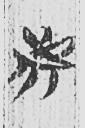我
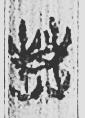莫
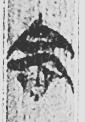命
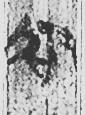卲
